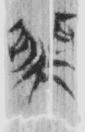{聑大}
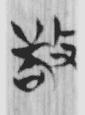敬
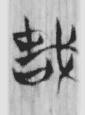哉
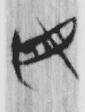母
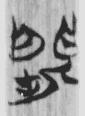{門才匕}
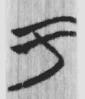于
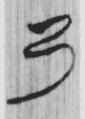乃
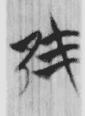隹
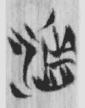{沈臼}
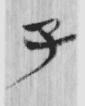子
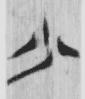少
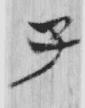子
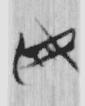母
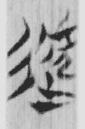{辶虎}
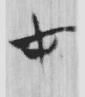才
